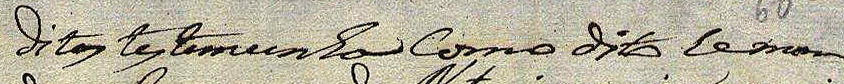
ditos testemunha como dito he man
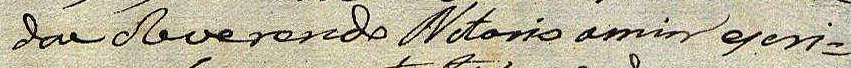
dou Reverendo Notario a mim escri
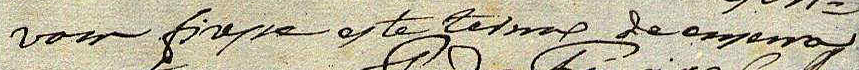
vam fizesse este termo de enserra
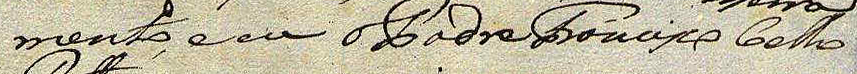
mento, e eu o Padre Francisco Coelho
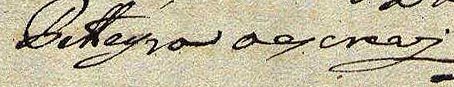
Petteyra o escrevj
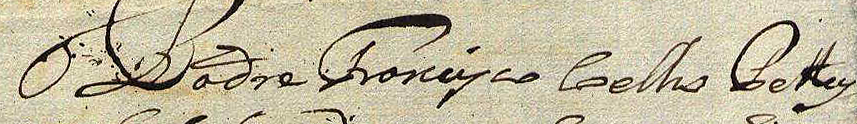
O Padre Francisco Coelho Pettey
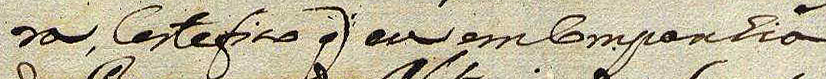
ra, Certefico q̄ eu em Companhia
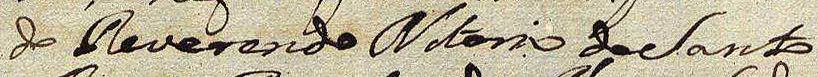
do Reverendo Notario do Santo
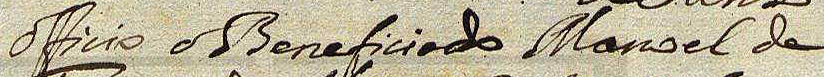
officio o Beneficiado Manoel de
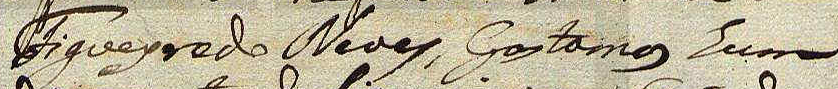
Figueyredo Neves, Gastamos hum
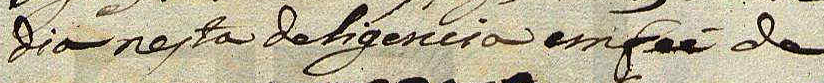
dia nesta deligencia em feé de
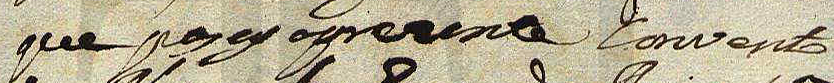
que pasey o prezente Convento
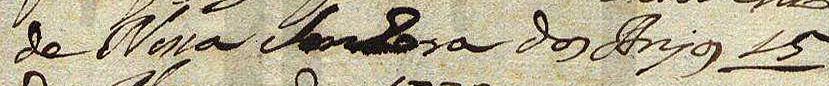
de Nossa Senhora dos Anjos 15
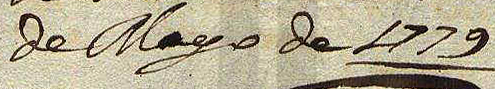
de Mayo de 1779
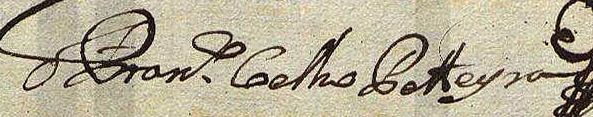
Fran.co Coelho Petteyra
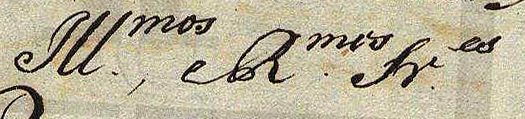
Ill.mos, e R.mos Sr.es
